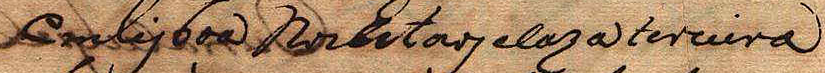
em lisboa nos Estaos e caza terceira
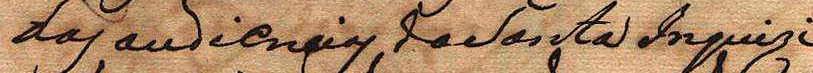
das audiencias da Santa Inquizi
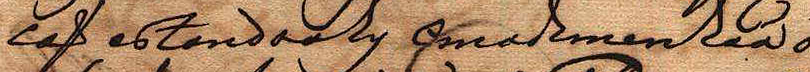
caõ estando ahy em a de menhaã o
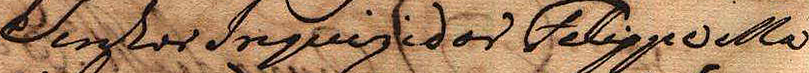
Senhor Inquizidor Felippe Ma
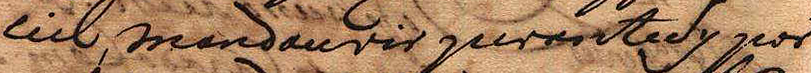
ciel, mandou vir perante sy por
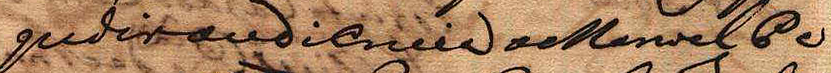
pedir audiencia a Manoel Pe
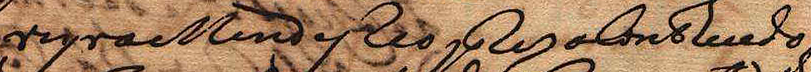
reyra Mendes Reo preso contheudo
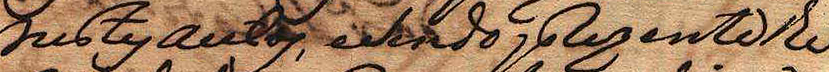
nestes autos, e sendo prezente lhe
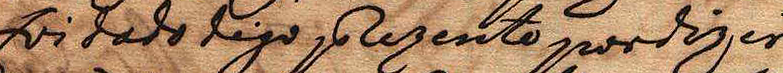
foi dado digo prezente por dizer
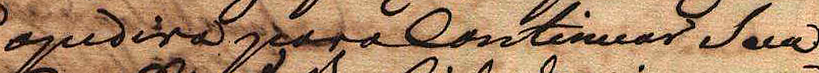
a pedira para continuar sua
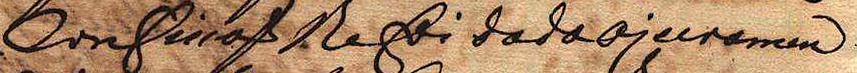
confissaõ lhe foi dado o juramen
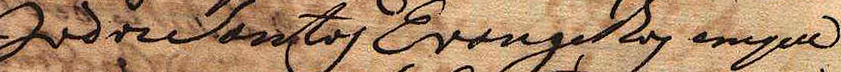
to dos Santos Evangelhos em que
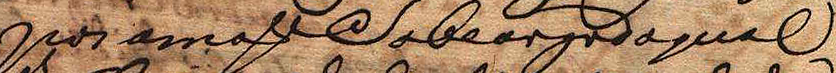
pos a maõ Sob cargo do qual
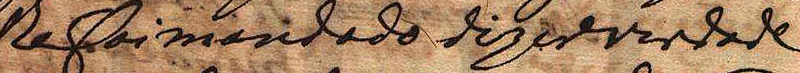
lhe foi mandado dizer verdade
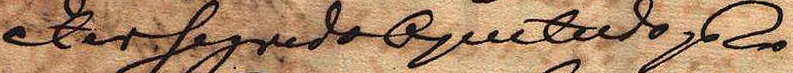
e ter segredo o que tudo pro
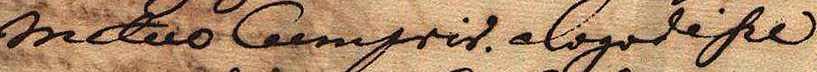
meteo cumprir. e logo disse
